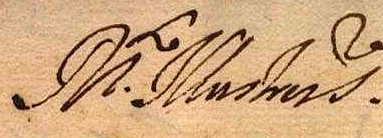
M.to Illustres S.res
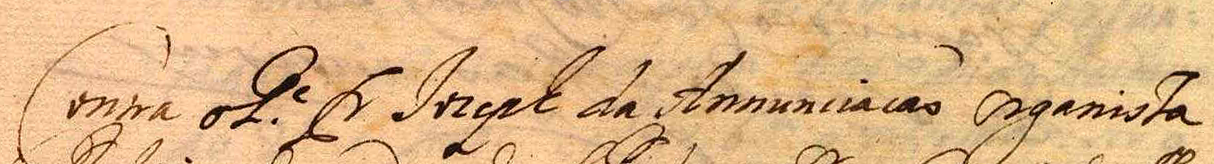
Contra o P.e fr Iozeph da Annunciaçaõ organista
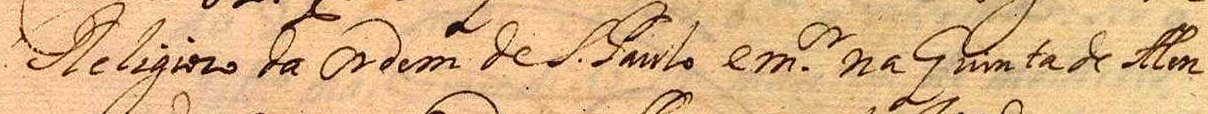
Religiozo da Ordem de S. Paulo e m.or na Quinta de Alen
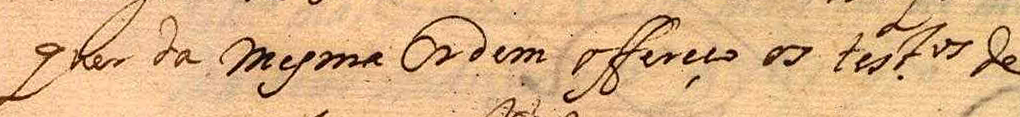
quer da mesma Ordem offereço os test.os de
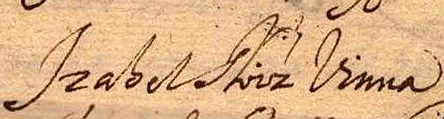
Jzabel Roiz̄ Viuua
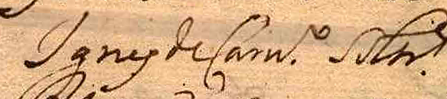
Ignes de Caru.o soltr.a
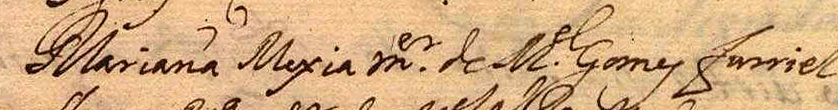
Mariana Mexia m.er de M.e Gomes farriel
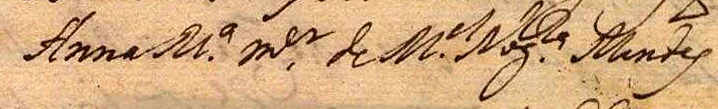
Anna M.a m.er de M.el Nog.ra Mendes
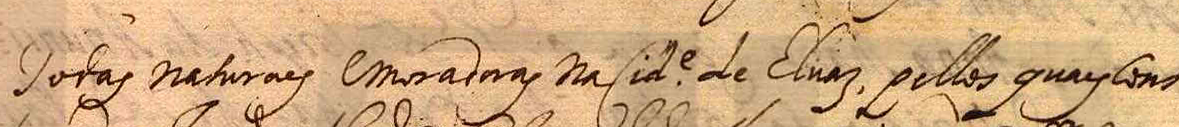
Todas naturaes e moradoras na Cid.e de Eluaz, pellos quaes Cons
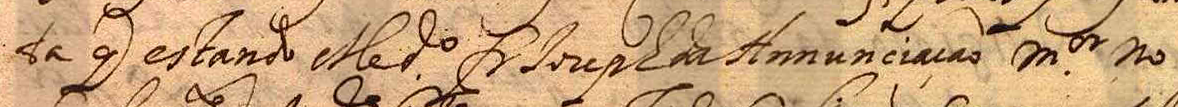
ta q̄ estando elle d.o fr Iozeph da Annunciaçaõ m.or no
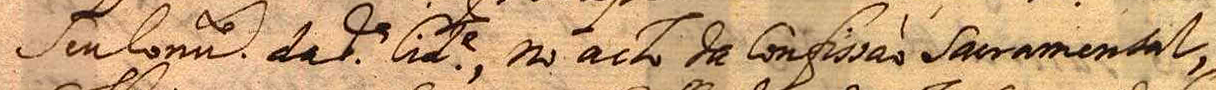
Seu Conu.to da d.a Cid.e, no acto da confissaõ Sacramental,
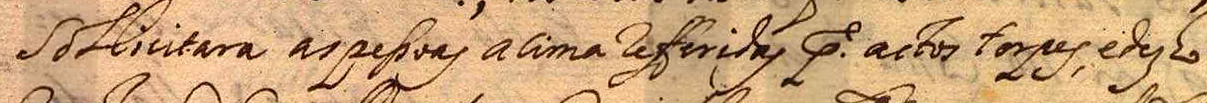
sollicitara as pessoas acima Refferidas p.a actos torpes, e dezho
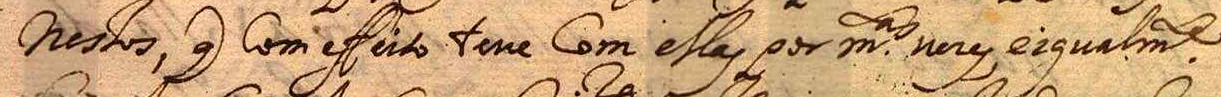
nestos, q̄ com effeito teue Com ellas por m.tas uezes, e igualmte.
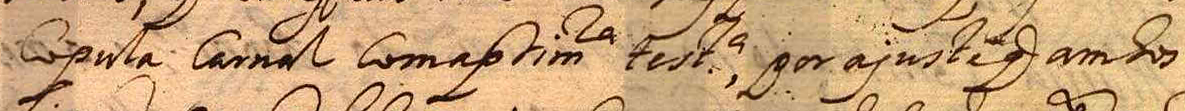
Copula Carnal com a primra test.a, por ajuste q̄ ambos
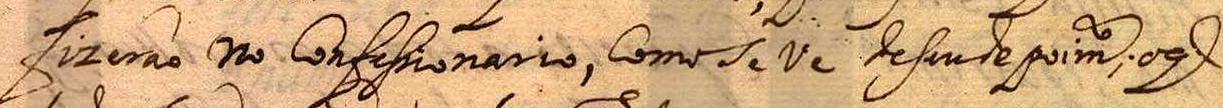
fizerão no Confessionario, Como se ve de seu depoimto, o q̄
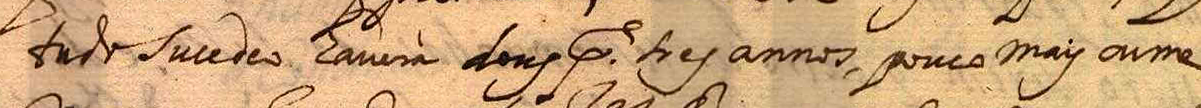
tudo sucedeo hauerà dous p.a tres annos, pouco mais ou me
